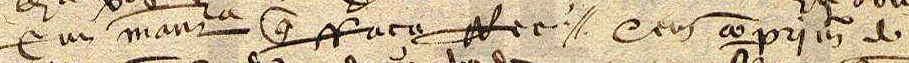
Em manra q̄ ffaça ffee .//. e em c̄oprjmto do
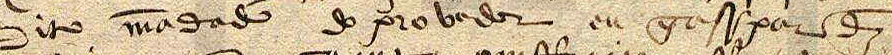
dito mādado do provedor eu gaspar dz̄
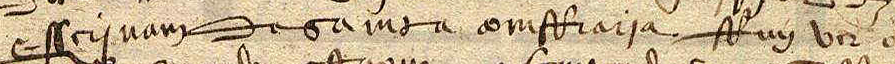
Esscrjuam da samta comffrarja ffuy ver o
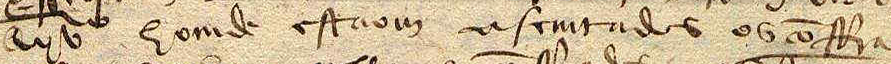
llyvro homde estaom asemtados os c̄offra
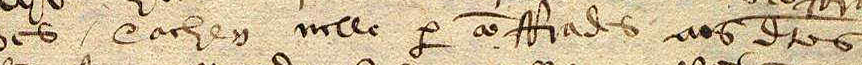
des / e achey nelle ꝑ cōffrades aos d̄tos
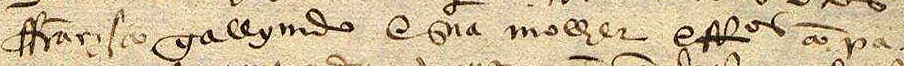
ffrācizco gallymdo e sua molher e ffos c̄o pa
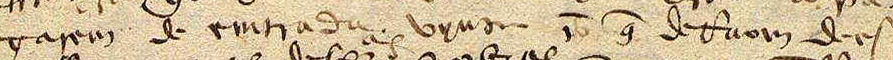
garem de emtrada vynte rs̄ q̄ deRaom de es
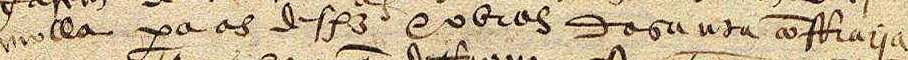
molla ꝑa as despzas e obras da santa c̄offrarja
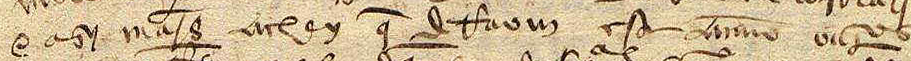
e asy majs achey q̄ deRaom este anno outros
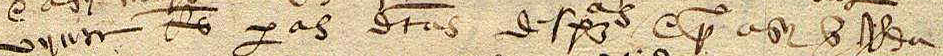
vynte R̄s ꝑ as d̄tas despzas e p̄o asy ꞩ ꝟda
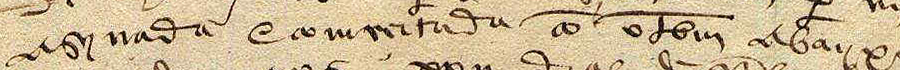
asynada e comcertada c̄o o t̄bm abayxo
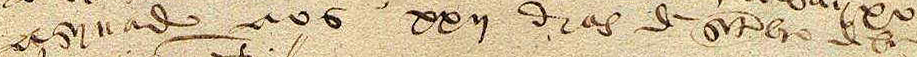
asynado aos xxij dias de setēbro de bc
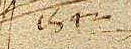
1542
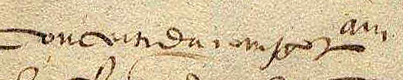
Concertada comjgo tam
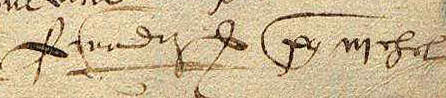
fernā diz p̄g njchel
